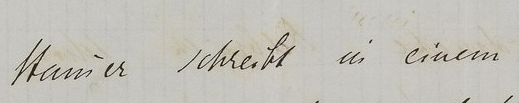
Hammer schreibt in einem heute eingegangenen
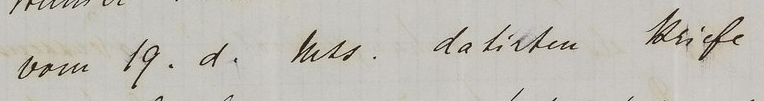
vom 19. d. Mts. datirten Briefe:
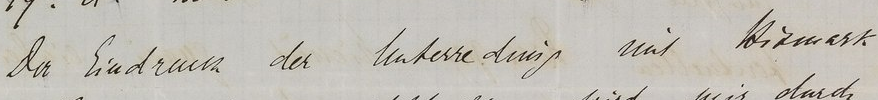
«Der Eindruck der Unterredung mit Bismark
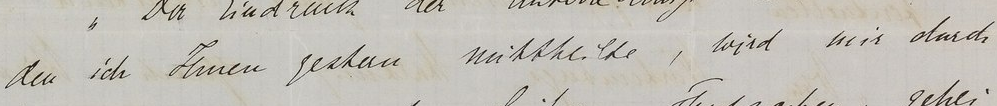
den ich Ihnen gestern mittheilte, wird mir durch
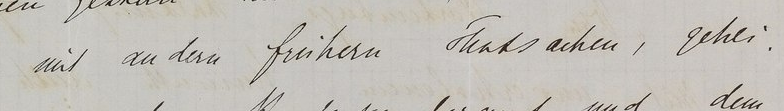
mit andern frühern Thatsachen, gehei-
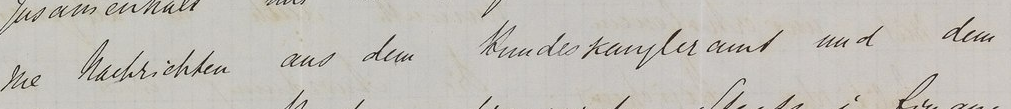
me Nachrichten aus dem Bundeskanzleramt und dem
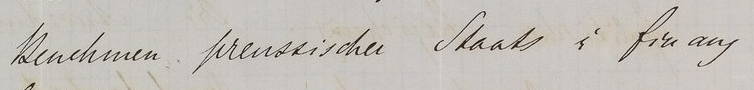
Benehmen preussischer Staats- u Finanz-
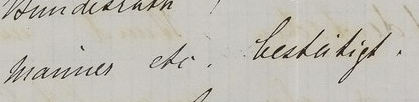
männer etc. bestätigt.
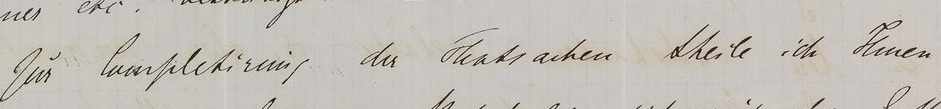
Zur Completirung der Thatsachen theile ich Ihnen
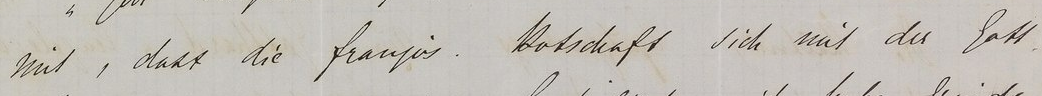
mit, dass die französ. Botschaft sich mit der Gott-
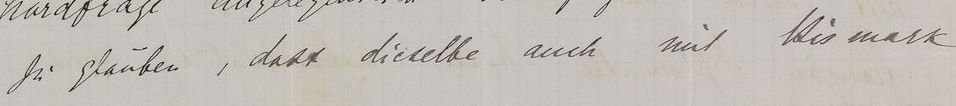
zu glauben, dass dieselbe auch mit Bismark
